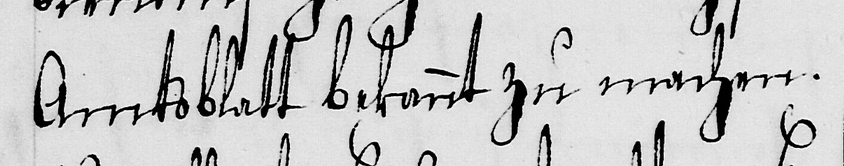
Amtsblatt bekannt zu machen.
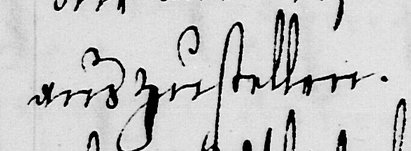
auszustellen.
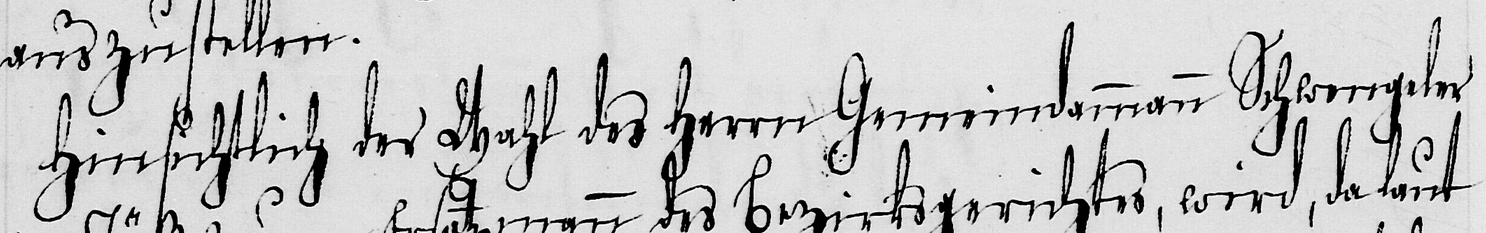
Hinsichtlich der Wahl des Herrn Gemeindammann Schwengeler
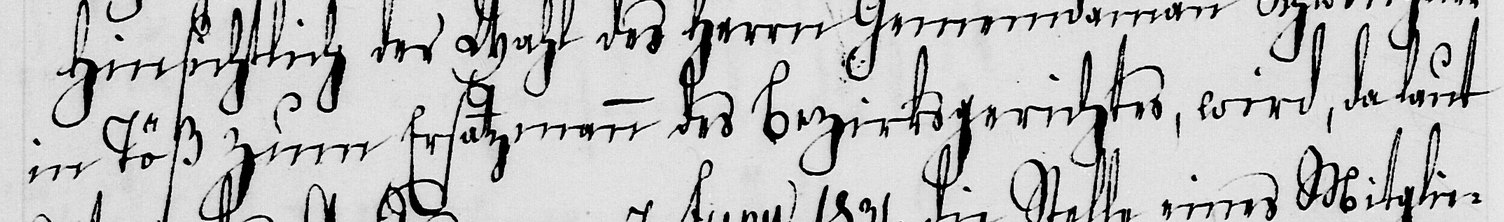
in Töß zum Ersatzmann des Bezirksgerichtes, wird, da laut
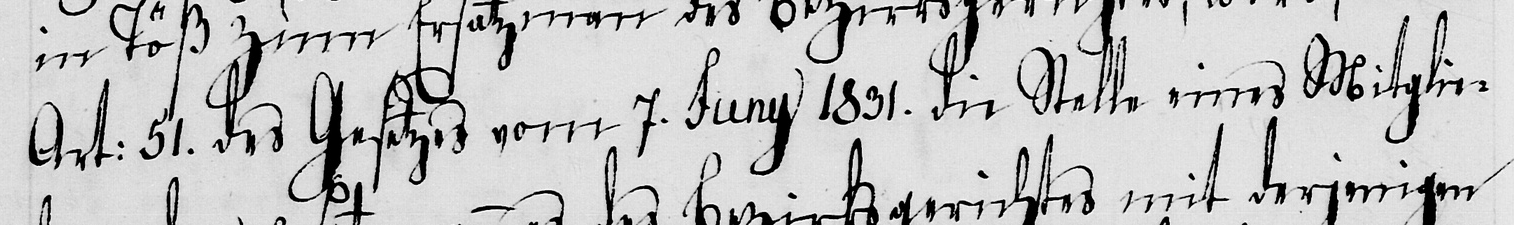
Art: 51. des Gesetzes vom 7. Juny 1831. die Stelle eines Mitglie¬
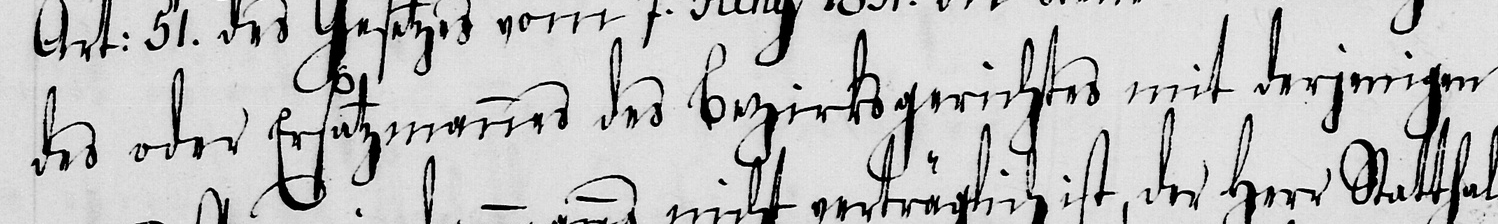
des oder Ersatzmannes des Bezirksgerichtes mit derjenigen
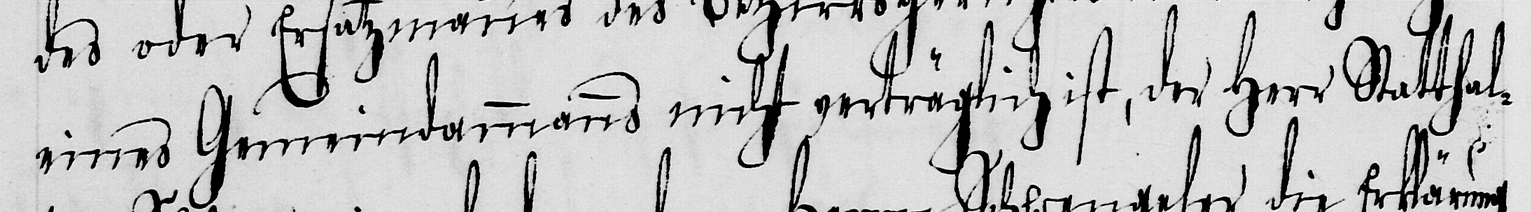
eines Gemeindammannes nicht verträglich ist, der Herr Stattha¬
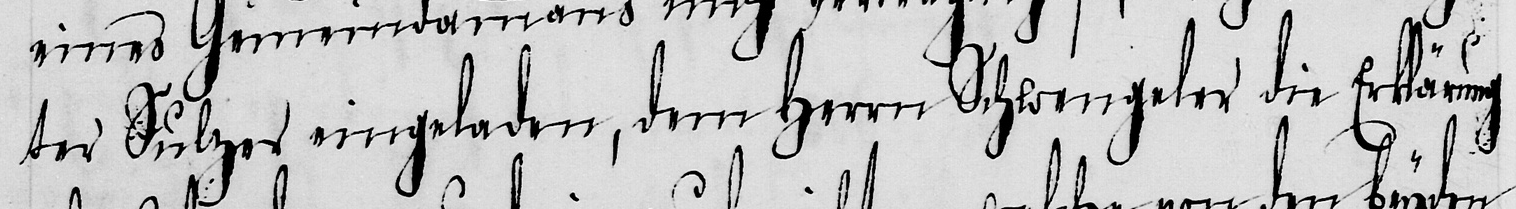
lter Sulzer eingeladen, dem Herrn Schwengeler die Erkläru¬
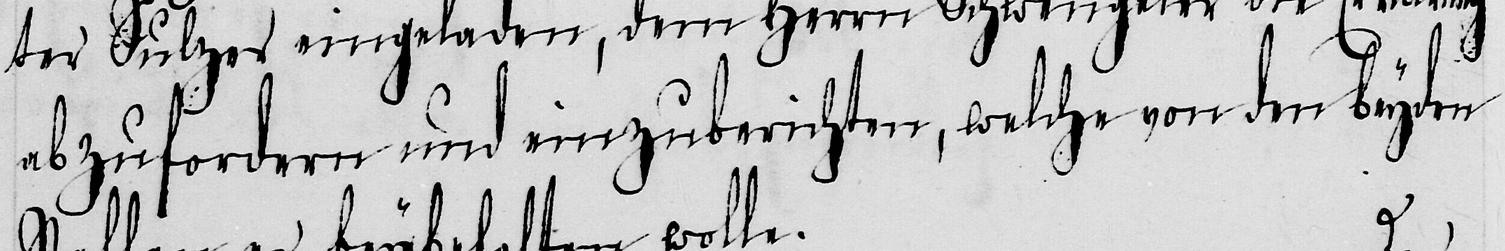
abzufordern und einzuberichten, welche von den beyden
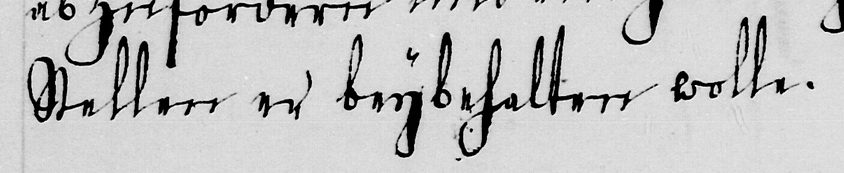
Stellen er beybehalten wolle.
